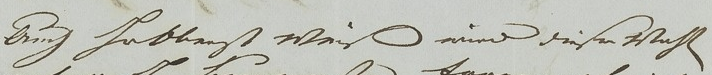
Auch Hr Oberst Weiß wird dieser Wahl
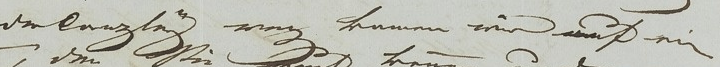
Der Canzley wegen kamen wir auf einen
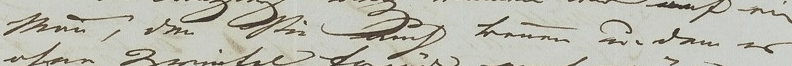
Mann, den Sie auch kennen u. dem es
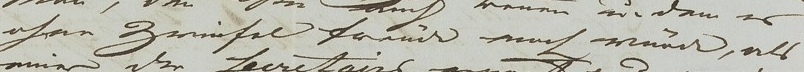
ohne Zweifel Freude machen würde, als
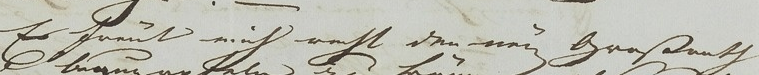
Es freut mich recht den neuen Großrath
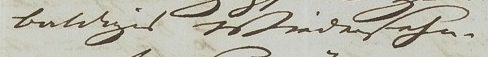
baldiges Wiedersehen.
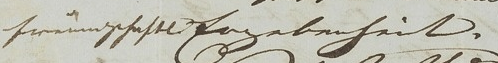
freundschaftl. Ergebenheit.
